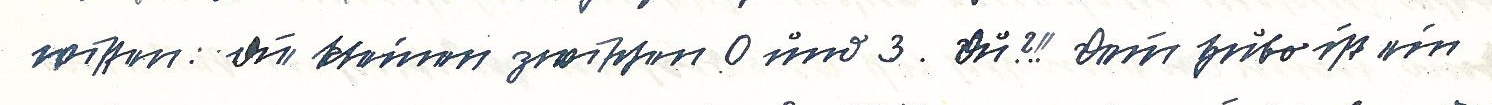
wissen: die kleinen zwischen 0 und 3. Du?!! Dein Hubo ist ein
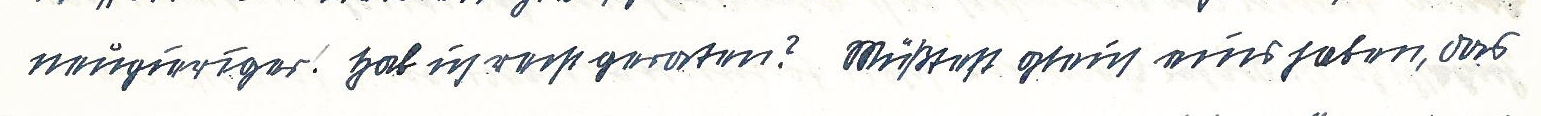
neugieriger!Hab ich recht geraten? Müßtest gleich eins haben, das
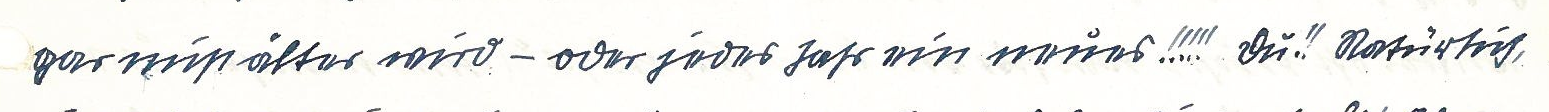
gar nicht älter wird – oder jedes Jahr ein neues!!!!! Du!! Natürlich,
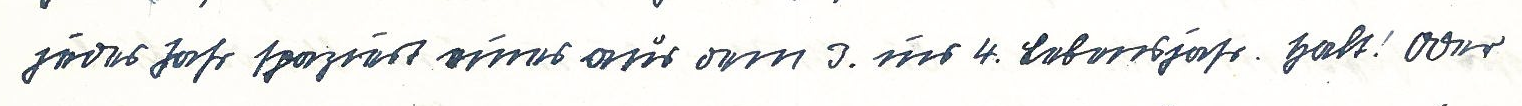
jedes Jahr spaziert eines aus dem 3. ins 4. Lebensjahr. Halt! Oder
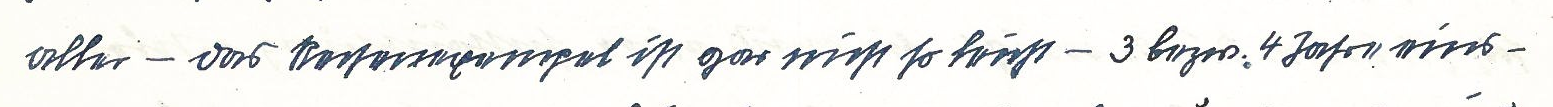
aller – das Rechenexempel ist gar nicht so leicht – 3 bezw 4 Jahre eines –
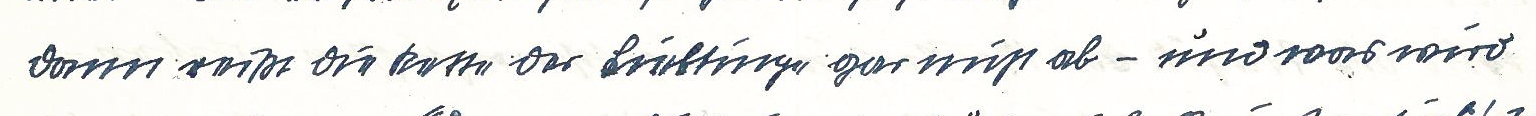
dann reißt die Kette der Lieblinge gar nicht ab – und was wird
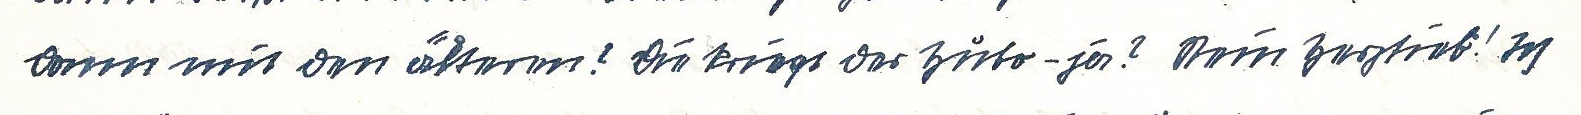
dann mit den älteren? Die kriegt der Hubo – ja? Nein Herzlieb! Ich
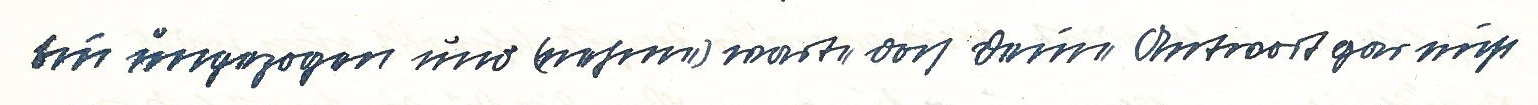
bin ungezogen und (nehme) warte doch Deine Antwort gar nicht
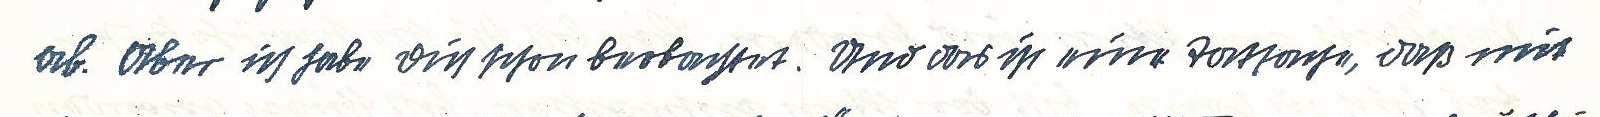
ab. Aber ich habe Dich schon beobachtet. Und das ist eine Tatsache, daß mit
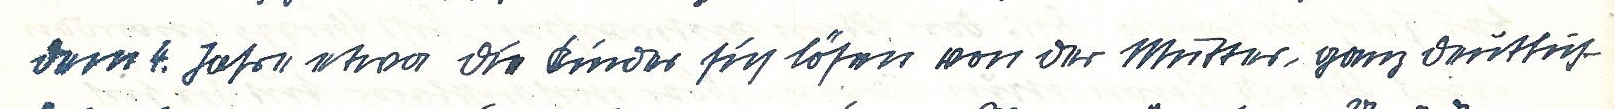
dem 4. Jahre etwa die Kinder sich lösen von der Mutter, ganz deutlich,
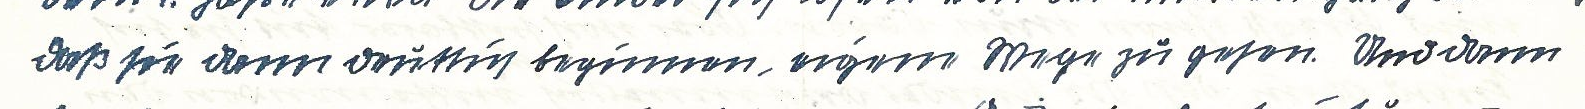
daß sie dann deutlich beginnen, eigene Weg zu gehen. Und dann
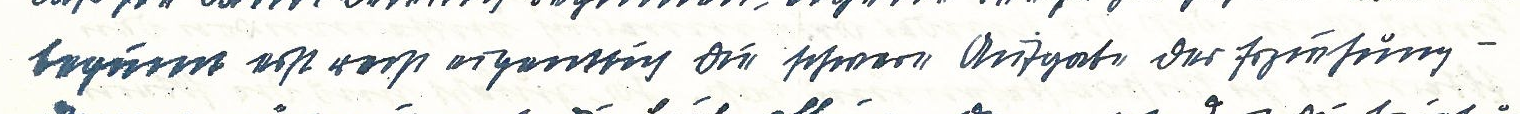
beginnt erst recht eigentlich die schwere Aufgabe der Erziehung –
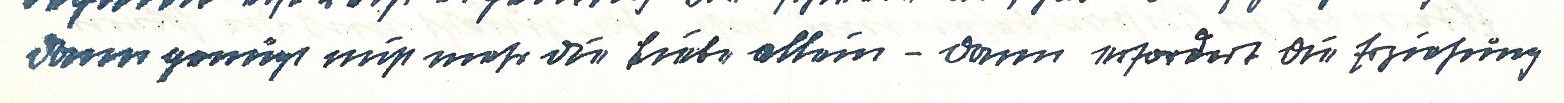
dann genügt nicht mehr die Liebe allein – dann erfordert die Erziehung
